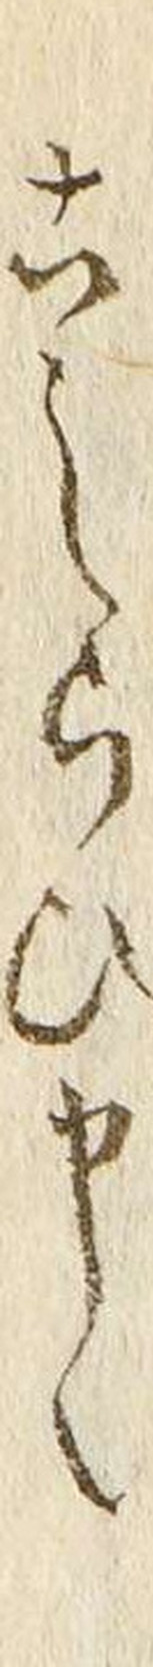こしらひ申候
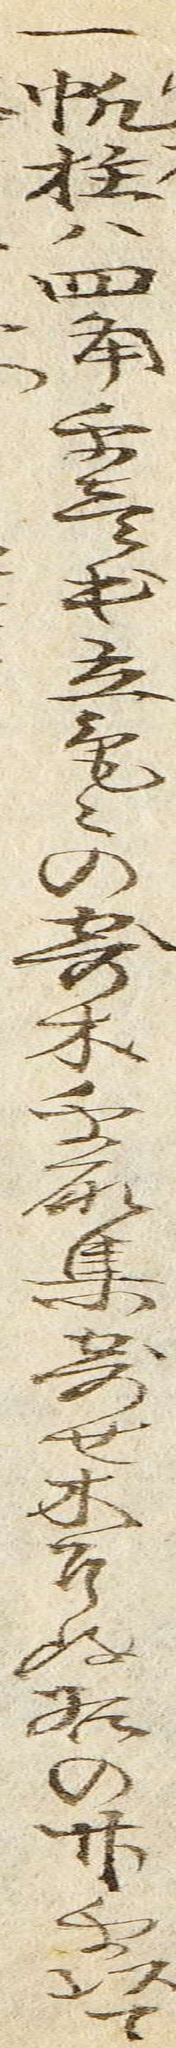一帆柱ハ四角を壱本立色々の寄木取集寄せ木に致右の竹を以て
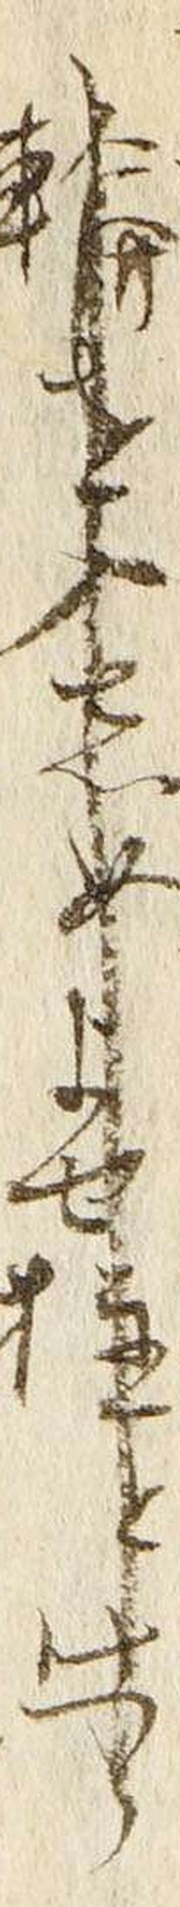輪を入しめよせ柱と仕候
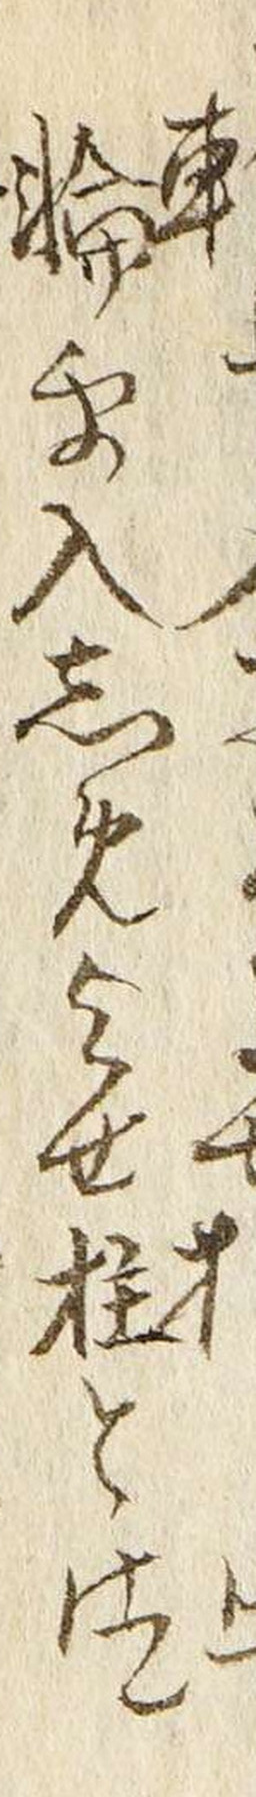輪を入しめよせ柱と仕候
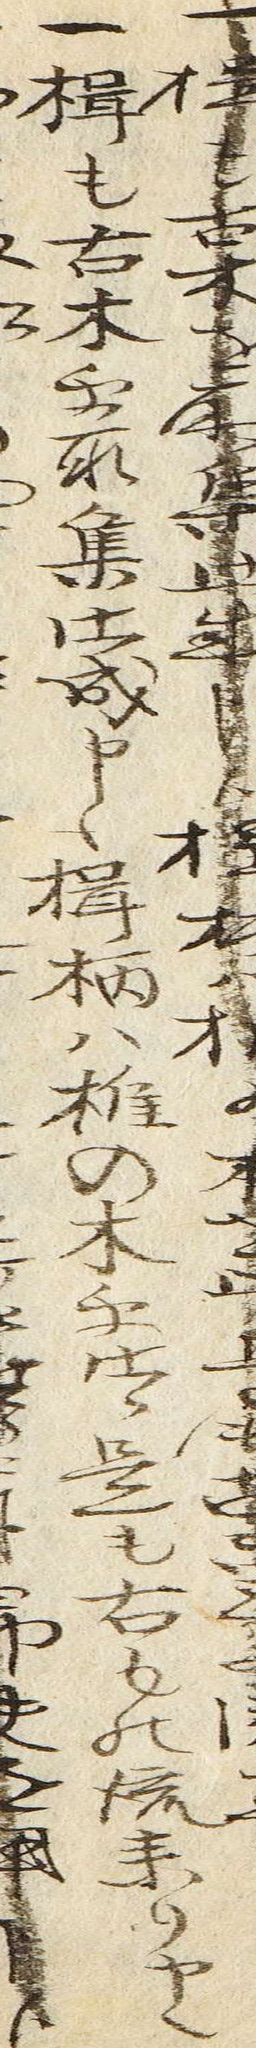一楫も古木を取集仕成申候楫柄ハ椎の木を仕候是も右もの流来り申候
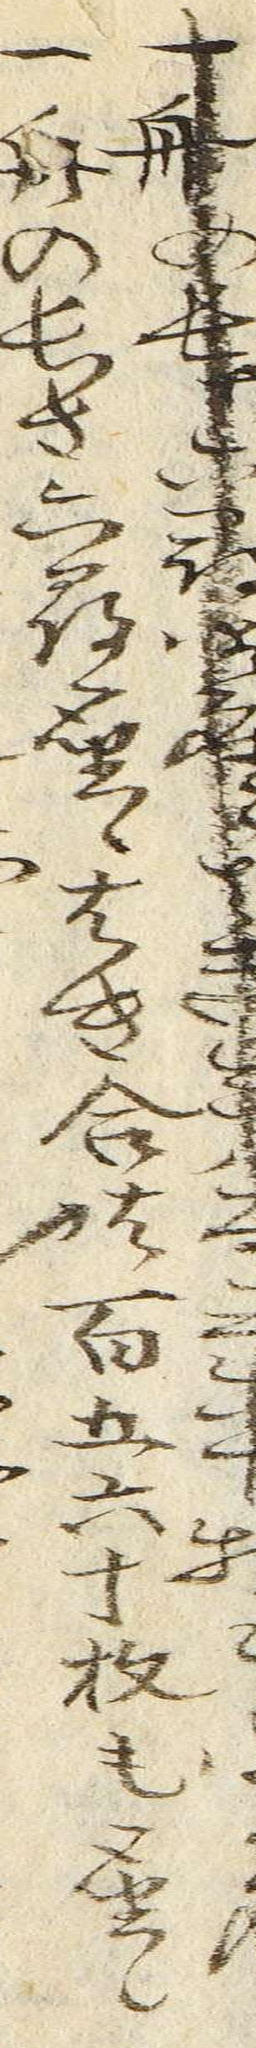一舟の長さ六尋御座候はき合者百五六寸枚も御座候
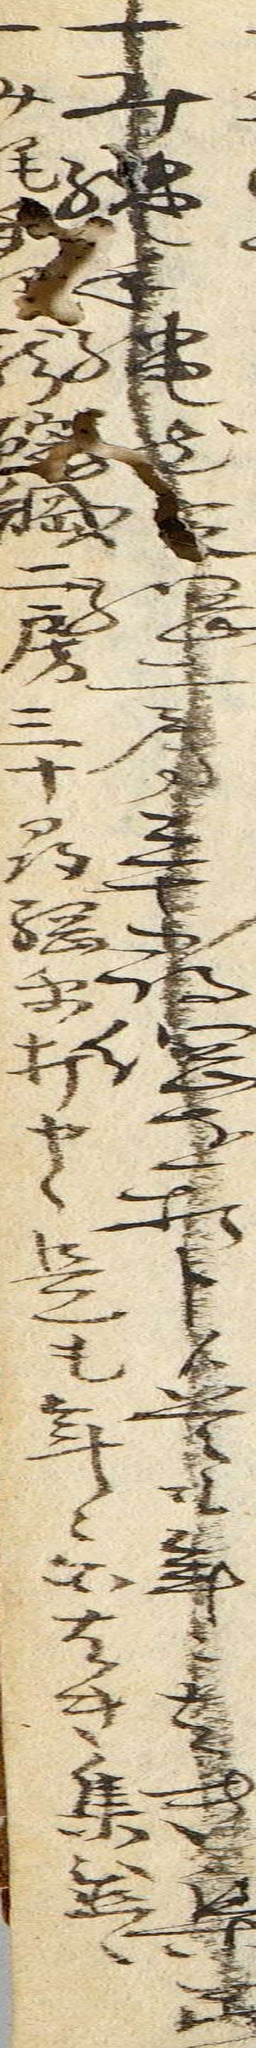一み手縄碇綱二房三十尋綱を打申候是も年々にはき集置候

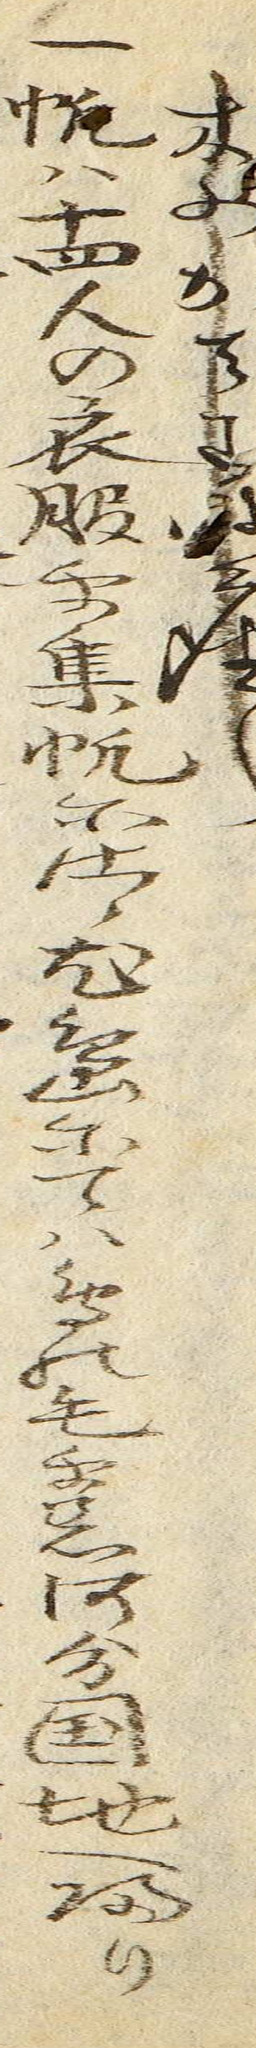一帆ハ十四人の衣服を集帆に仕候尤島にてハ鳥の毛を着何分国地へ帰り
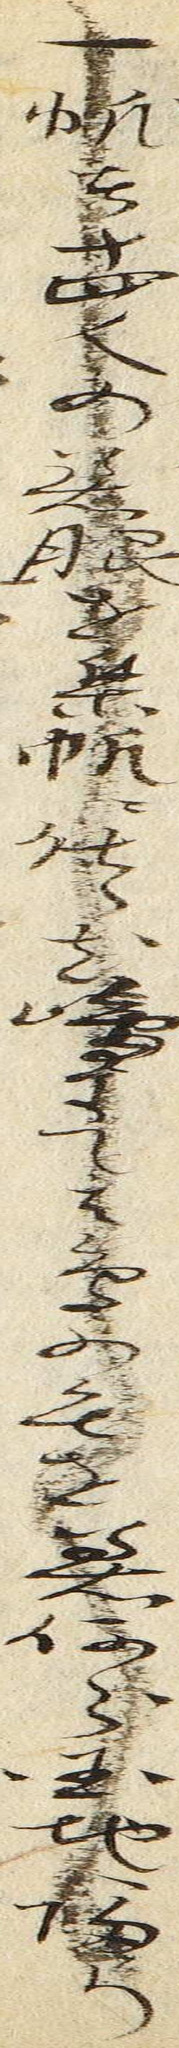一帆ハ十四人の衣服を集帆に仕候尤島にてハ鳥の毛を着何分国地へ帰り
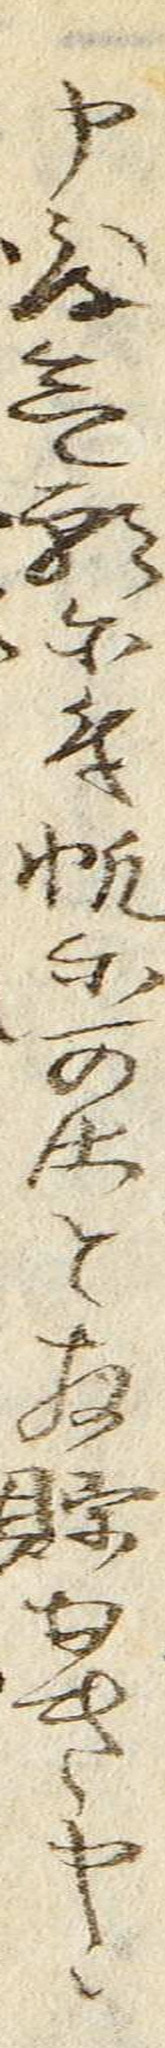申度念願に付帆に可仕と相貯おき申候
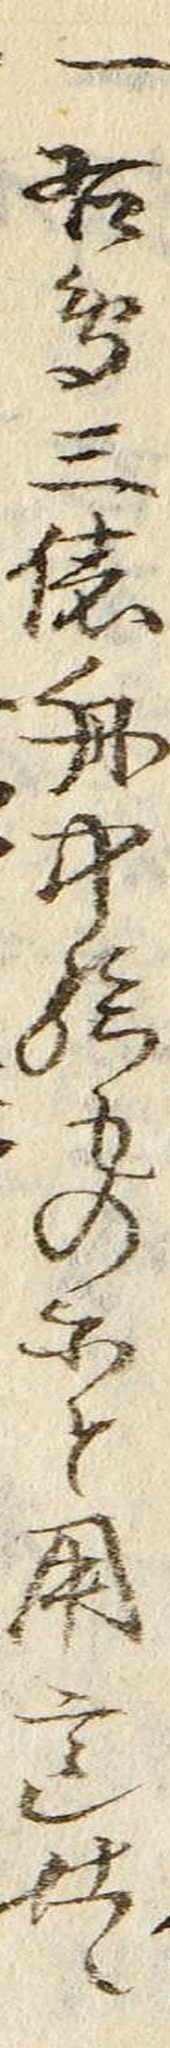一右鳥三俵舟中給ものにと用意仕候
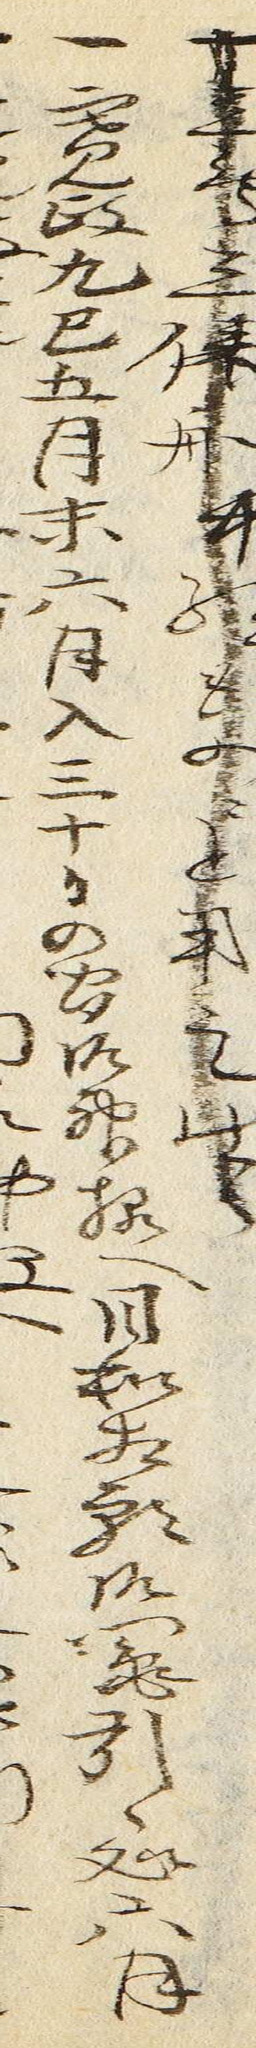一寛政九巳五月末六月入三十日の間御神様へ日和相願御鬮引候処六月
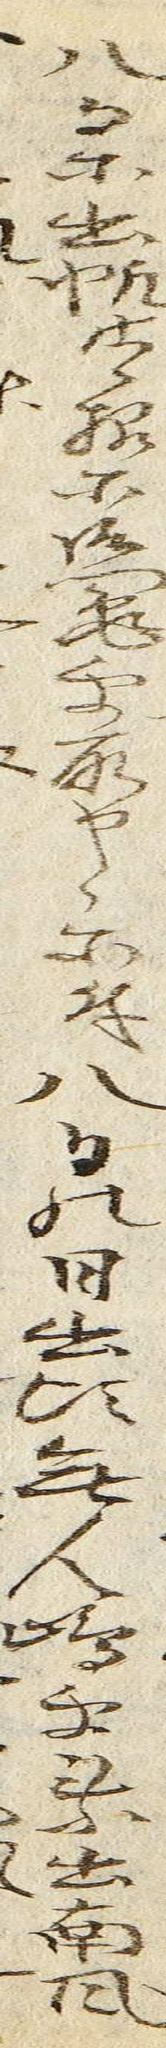八日に出帆仕候様に御鬮を取申候に付八日の日出頃無人嶋を乗出南風
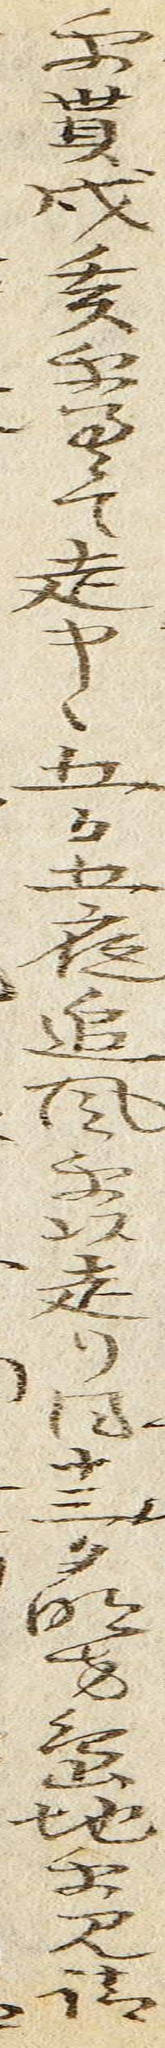を貰成亥を差て走申候五日五夜追風を以走り同十三日明方島地を見請
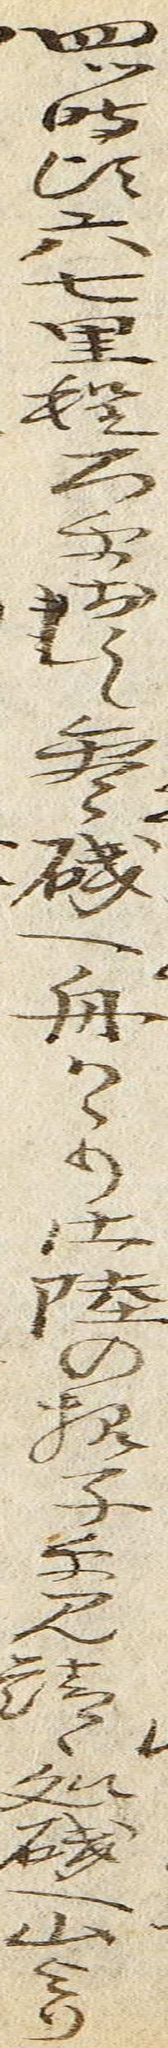四ツ時頃六七里程ろをおし参磯へ舟かゝり仕陸の様子を見請候処磯へ山より
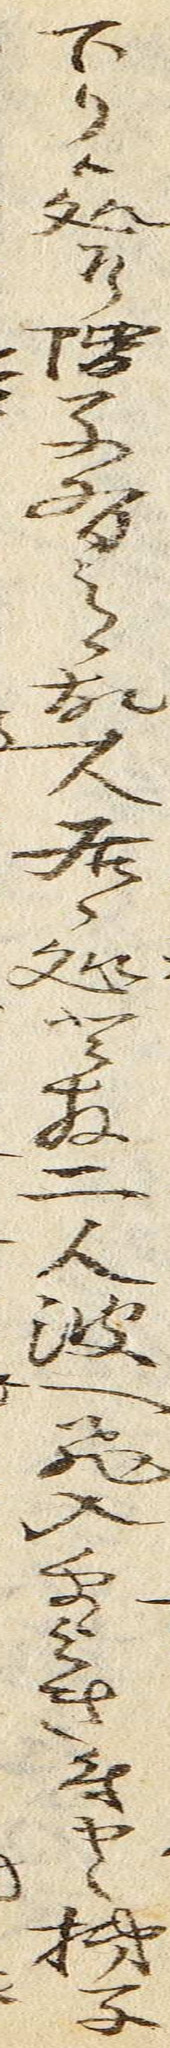下り候処に階子有之候故人居候処と存二人波へ飛入をよき付申候梯子
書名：無人島漂流書付
